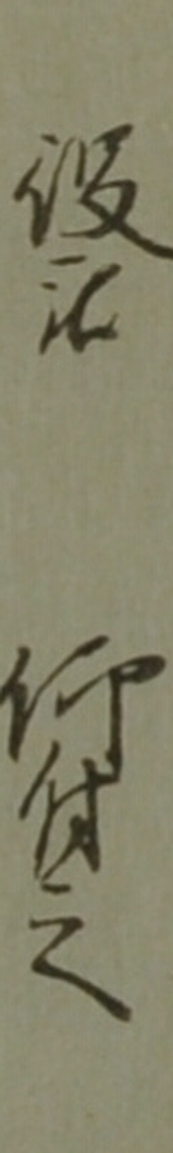役被仰付之
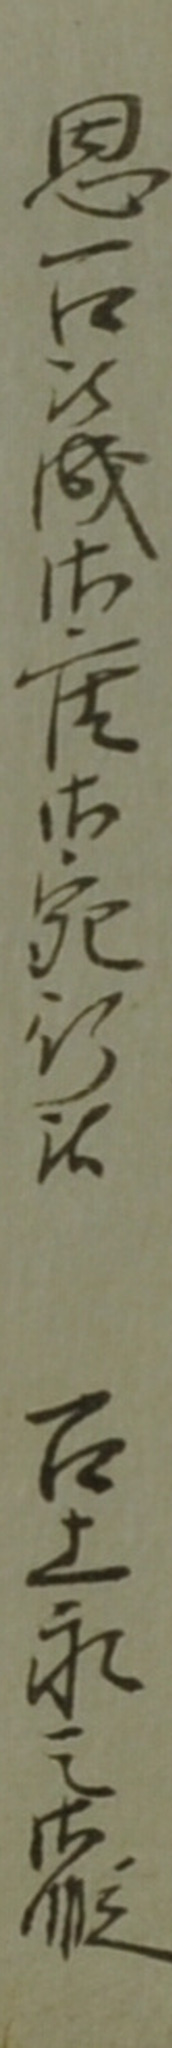思召被成御座御宛行被召上永之御暇
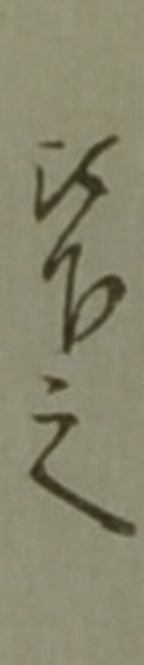被下之
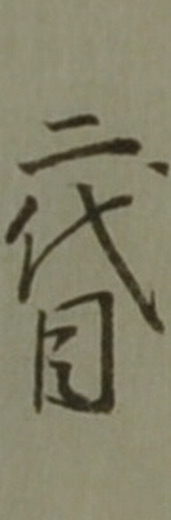二代目
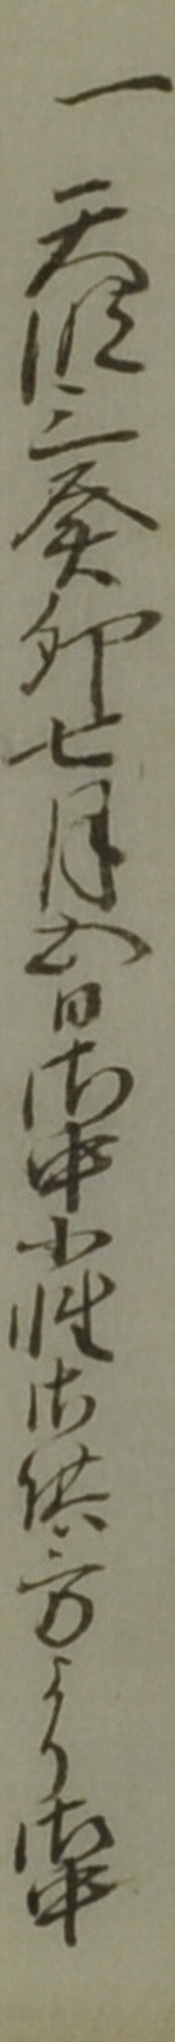一天明三癸卯七月五日御中小姓御供方より御中
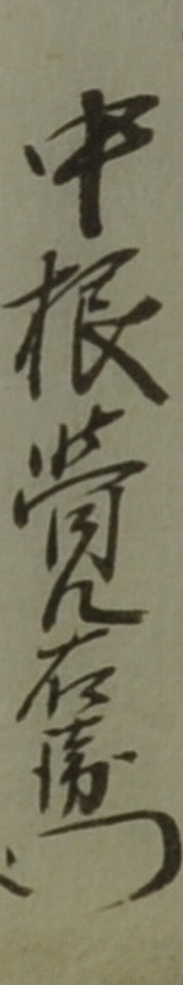中根覚右衛門
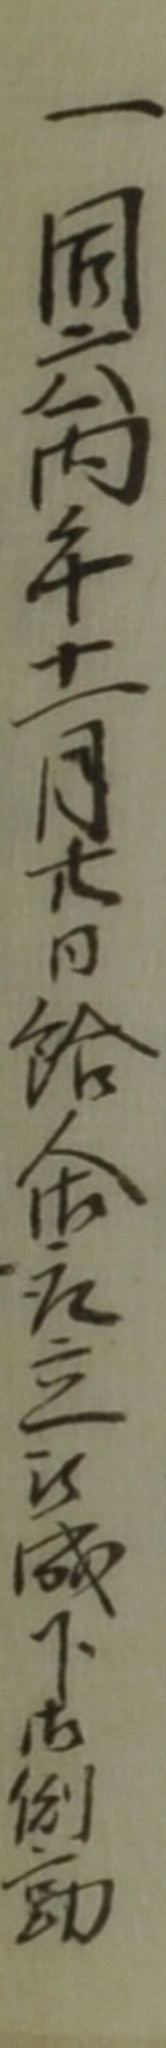一同六丙午十一月廿日給人御取立被成下御側勤
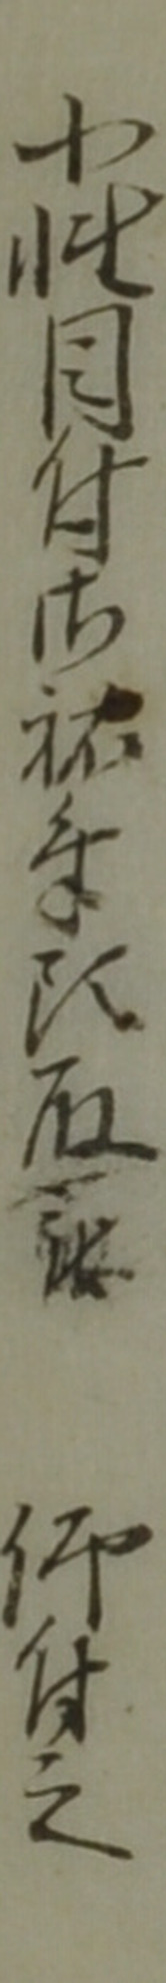小姓目付御祐筆頭取被仰付之
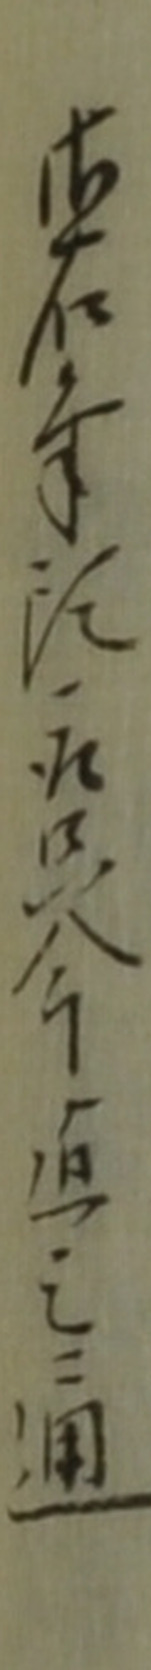御右筆頭取只今迄之通
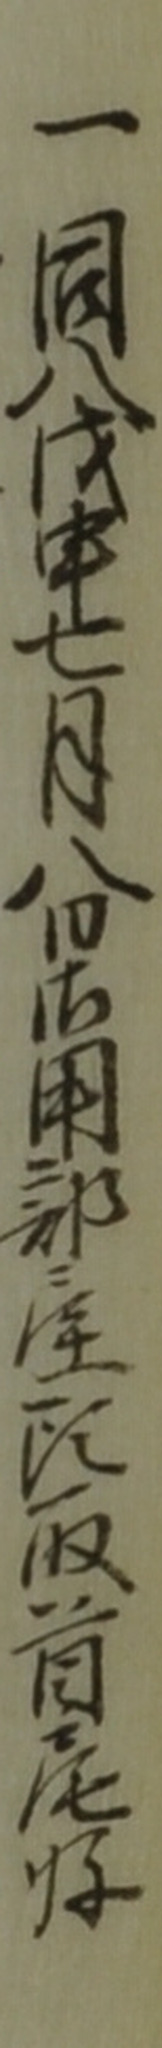一同八戊申七月八日御用部屋頭取首尾好
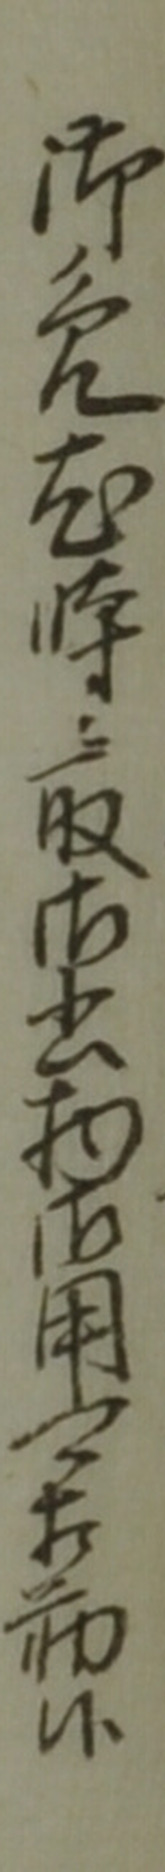御免尤時ニ取御書物御用可相勤候
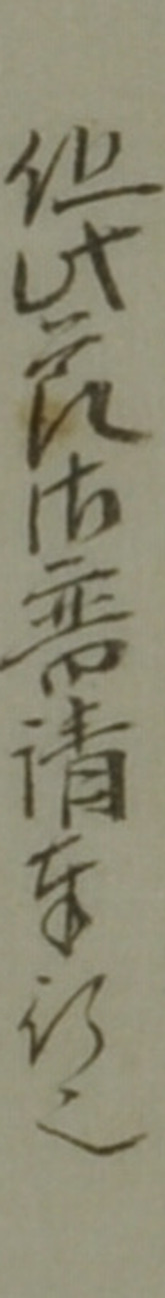但此節御普請奉行也
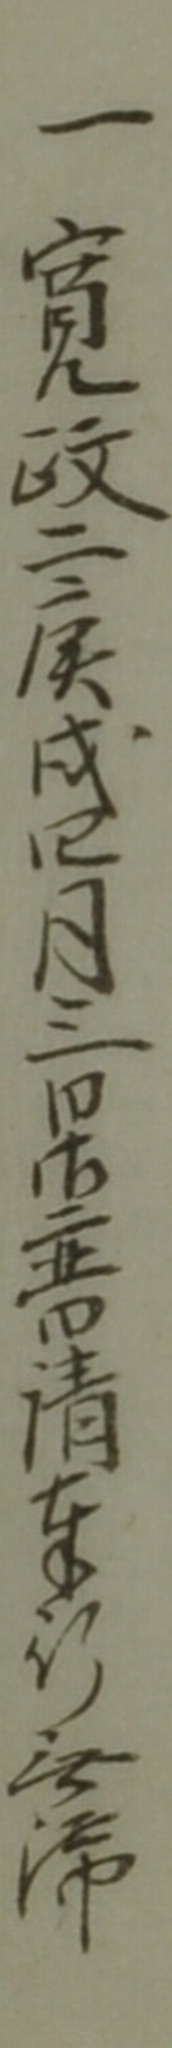一寛政二庚戌四月三日御普請奉行無滞
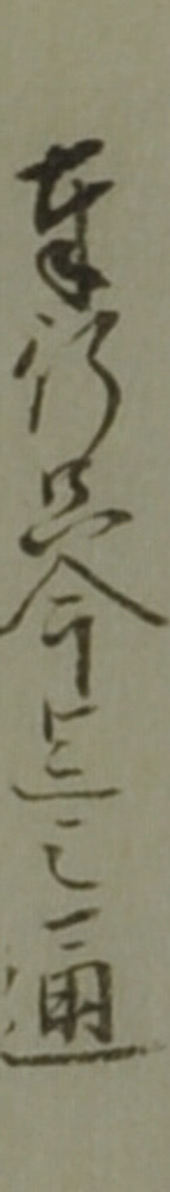奉行只今迄之通
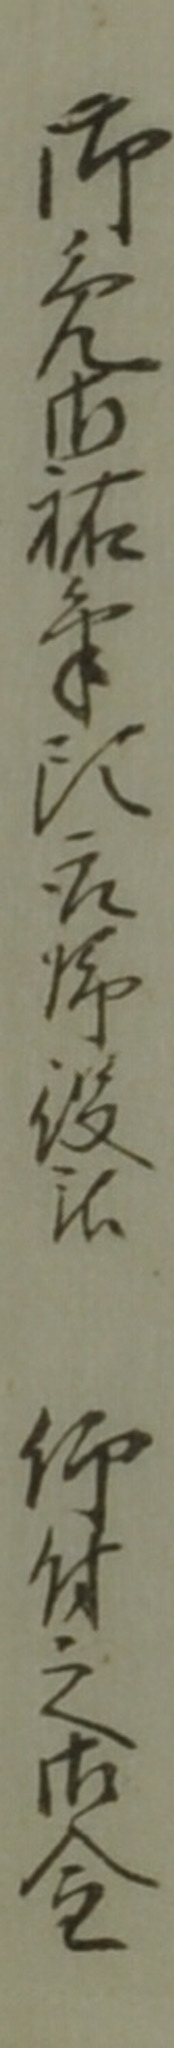御免御祐筆頭取帰役被仰付之御金
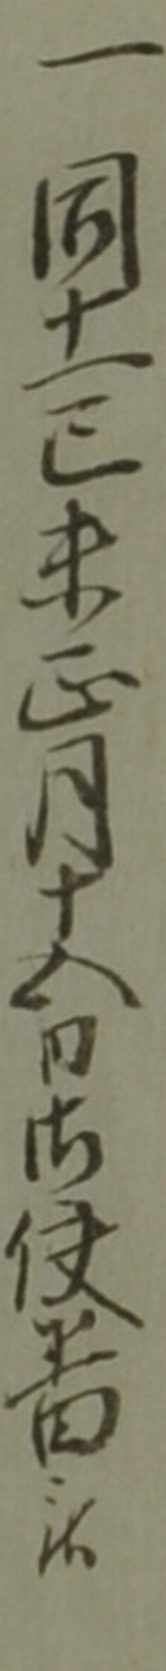一同十一己未正月十五日御使番被
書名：諸御役代々録（八）
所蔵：伊那市立高遠町図書館・合同会社AMANE
